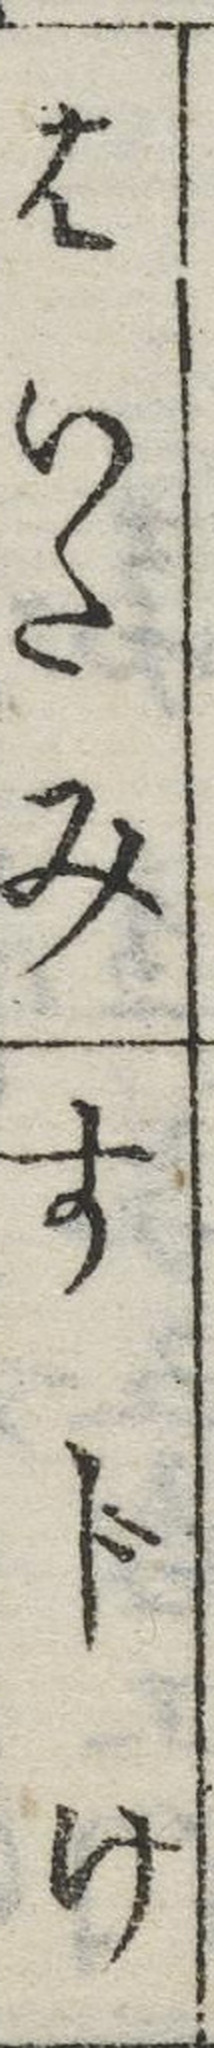はいたみすじけ
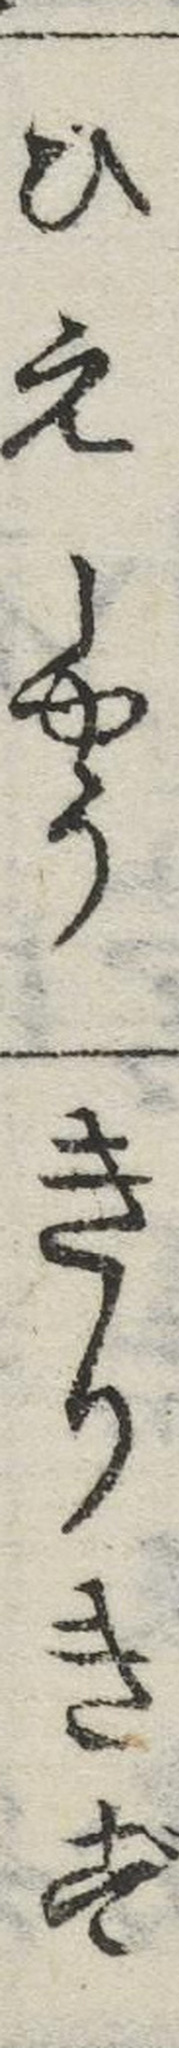ひえしやうきりきず
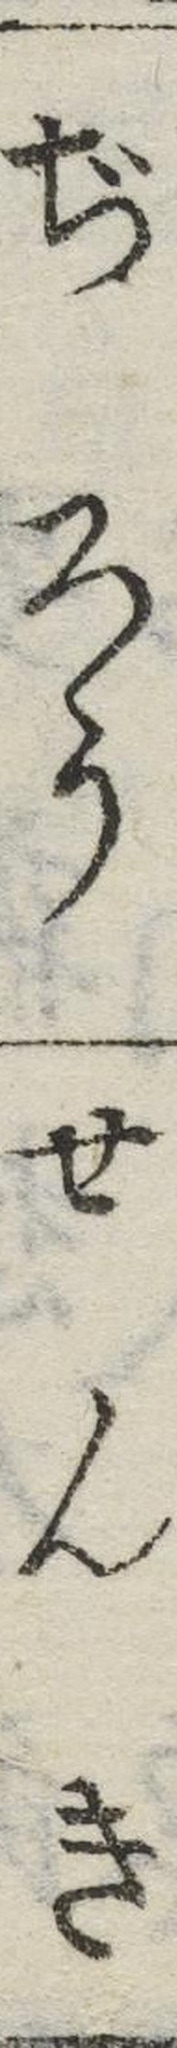ぢろうせんき
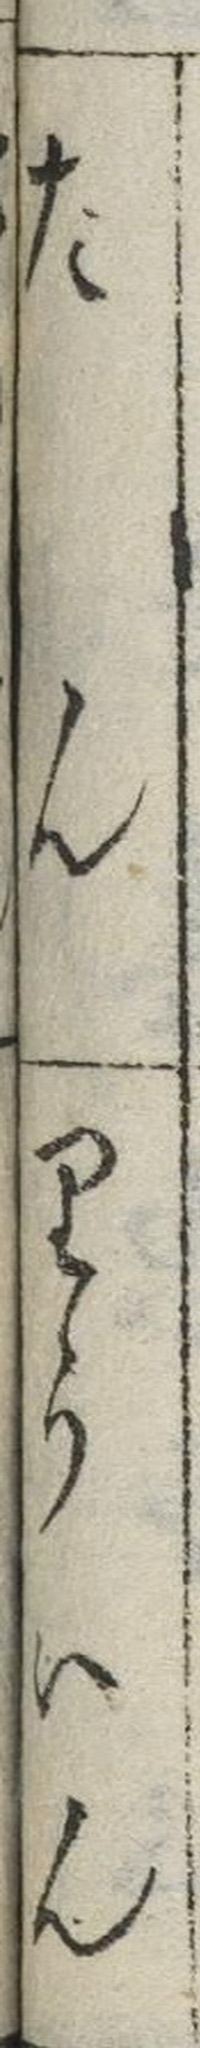たんりういん
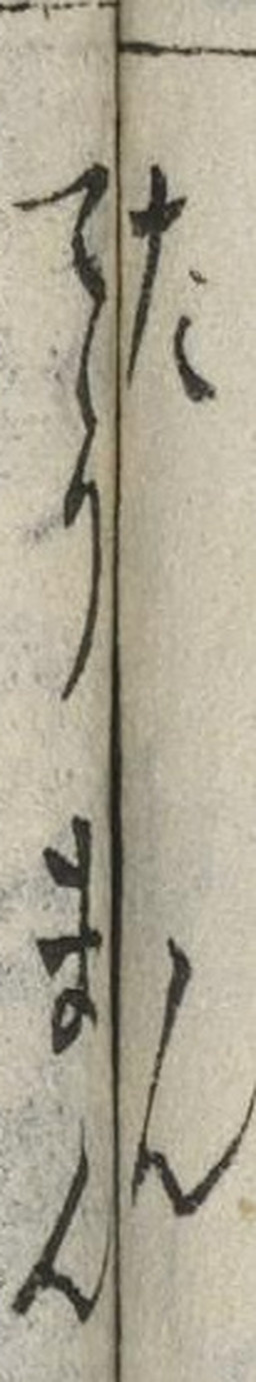てうまん
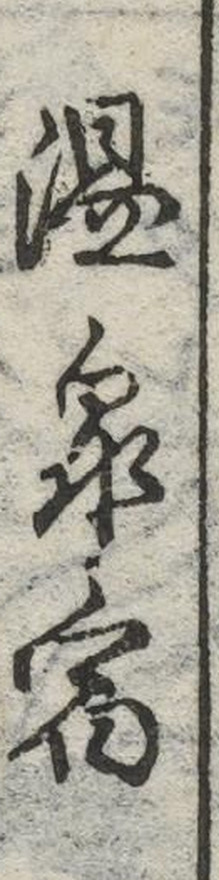温泉宿
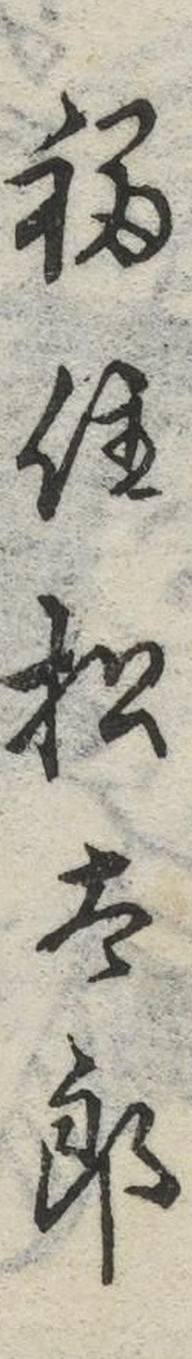福住松太郎
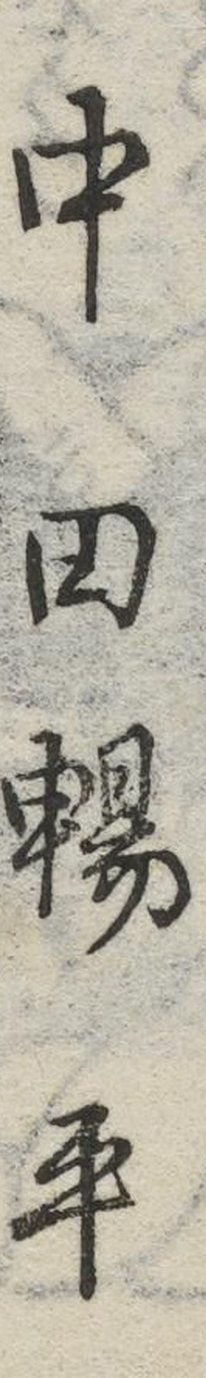中田暢平
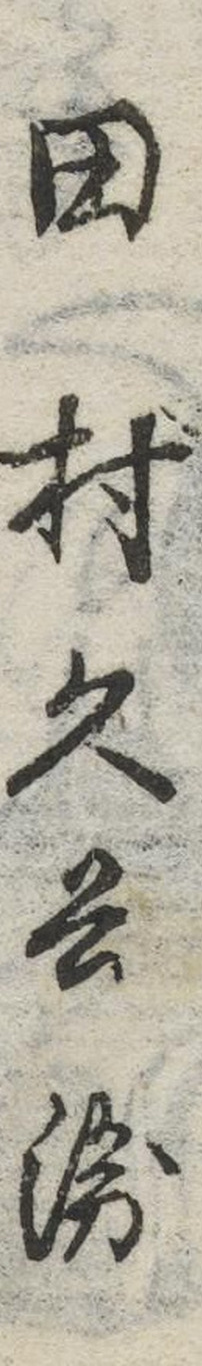田村九兵衞
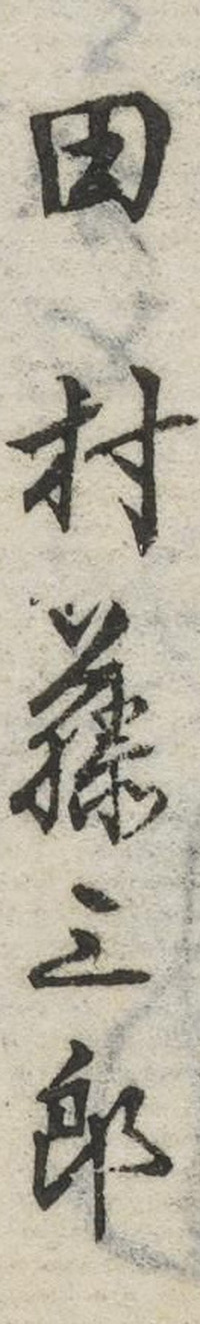田村藤三郎
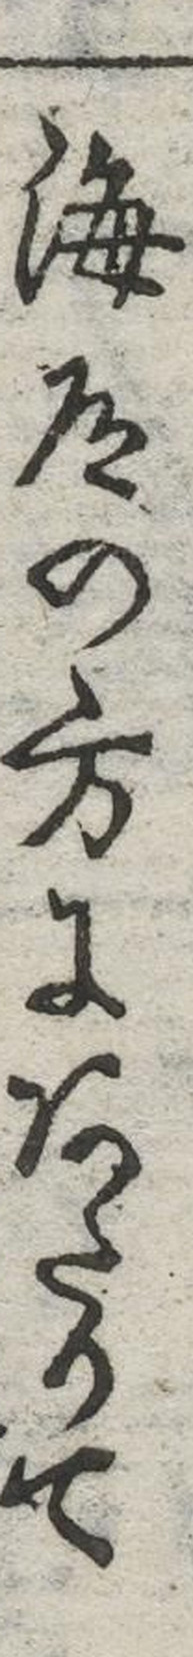海道の方にあたりて
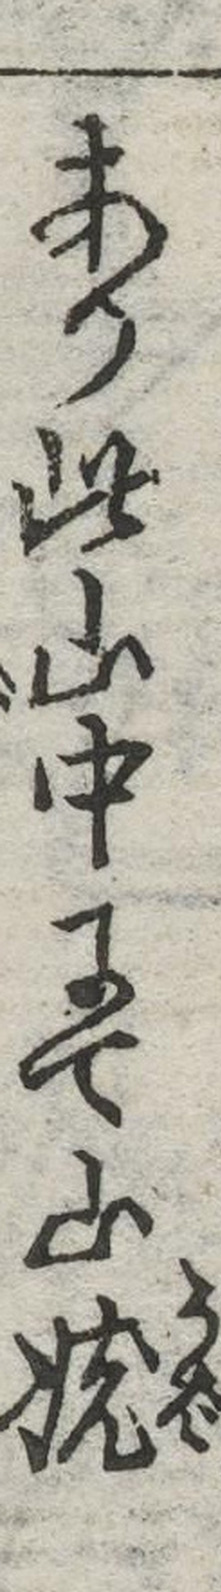あり此山中にて山姥
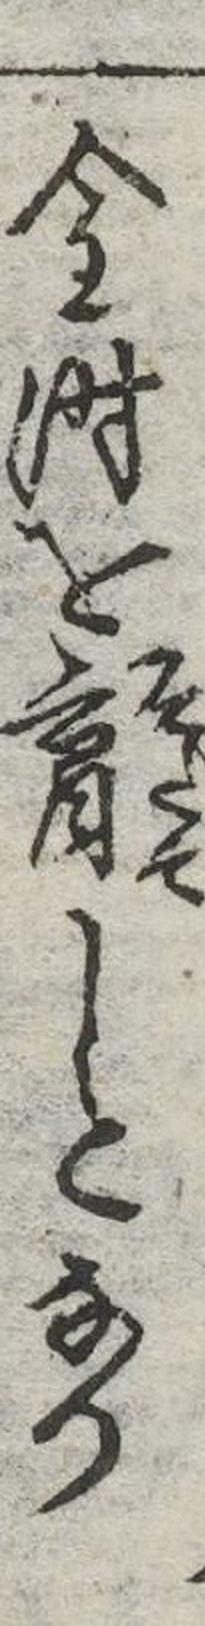金時を育しとなり
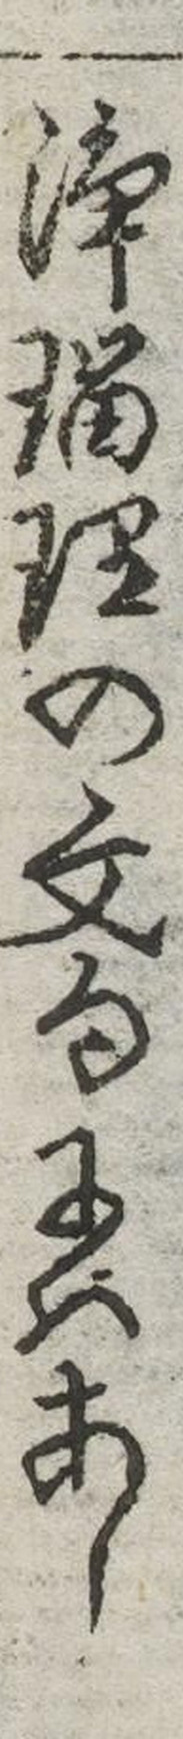浄瑠理の文句にはあし
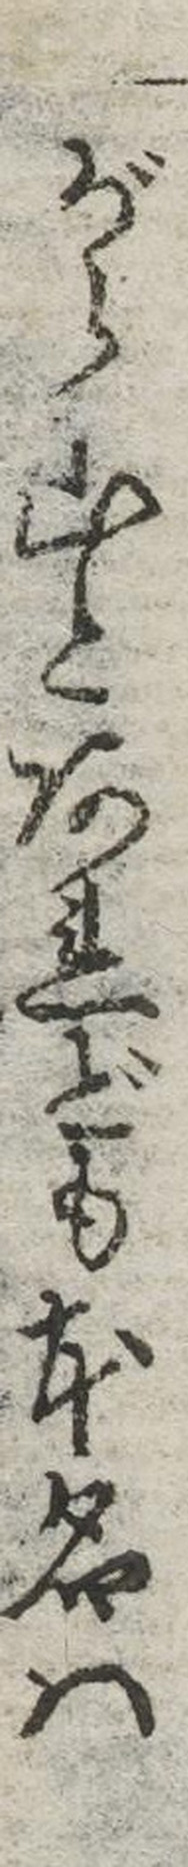がら山とあれども本名は
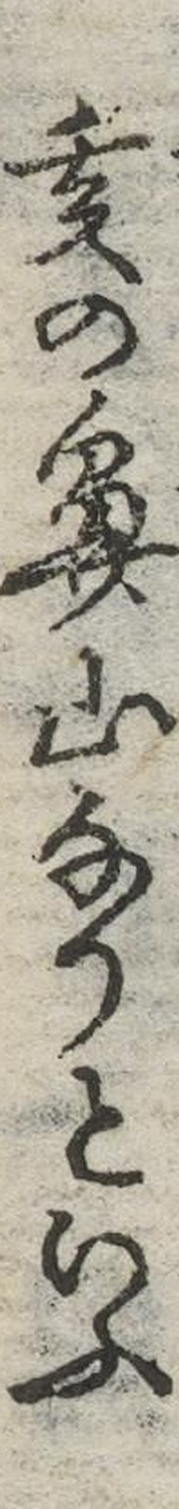亥の鼻山なりといふ
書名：諸國温泉遊覽記　全
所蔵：東京大学地震研究所図書室 Earthquake Research Institute Library, The University of Tokyo, JAPAN
